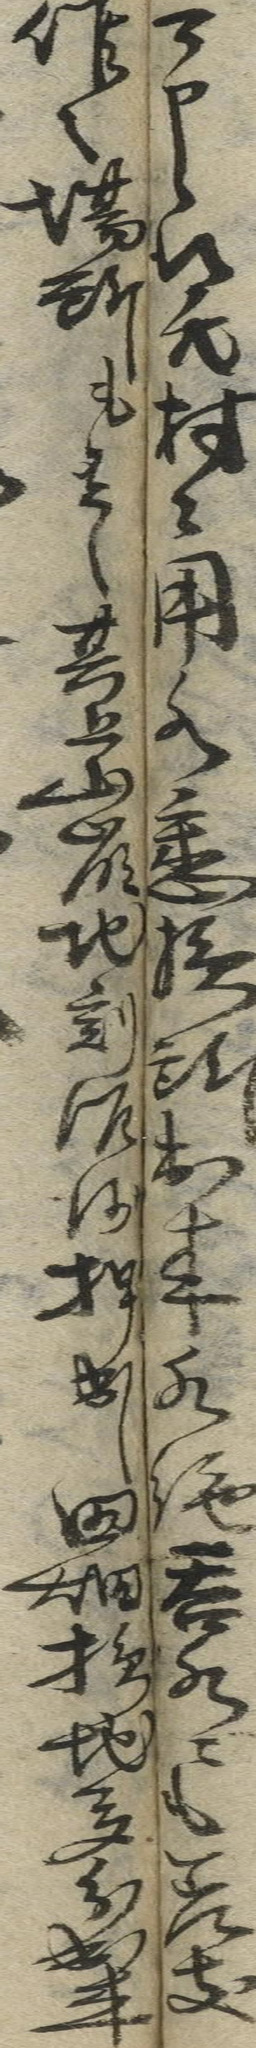候之場所も有之其上山崩地割泥砂押出田畑損地多分出来
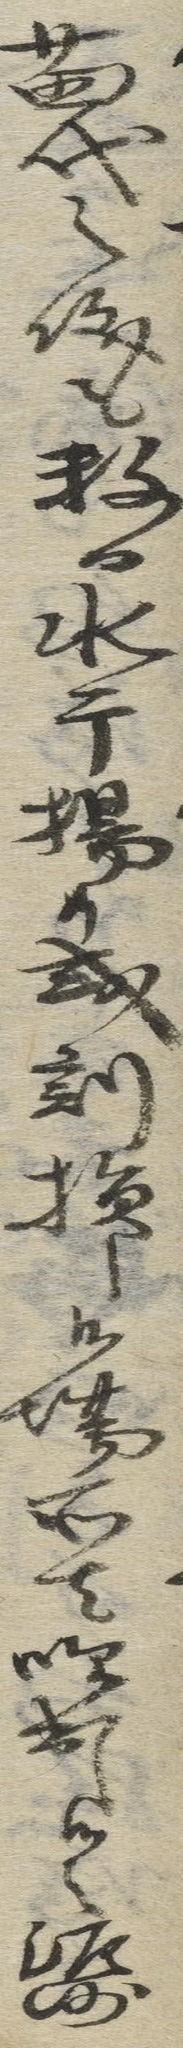苗代之儀も数日水干揚り或割損し候場所は吹出し口之泥砂
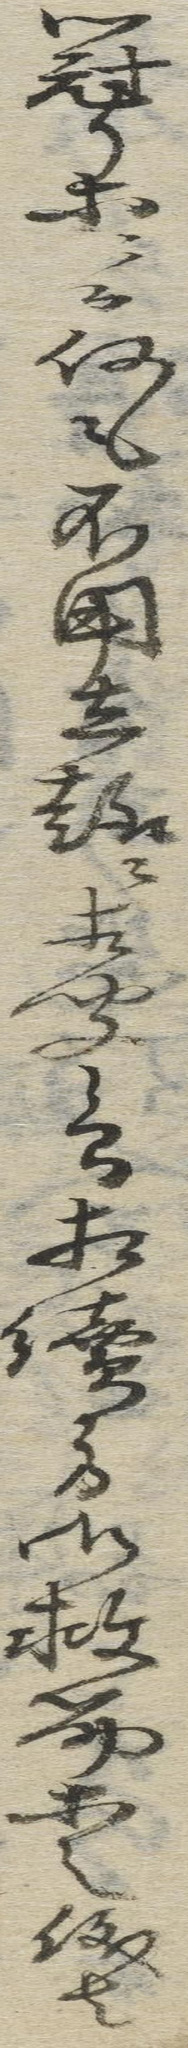冠り等二而何も不用立趣二相聞候間相続方御救筋等之儀は
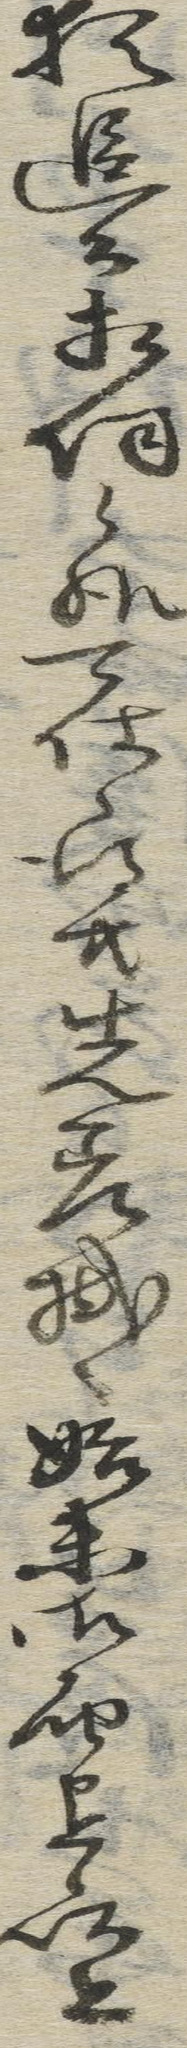猶追而相伺候様可仕候得共先差掛候始末御届申上候以上
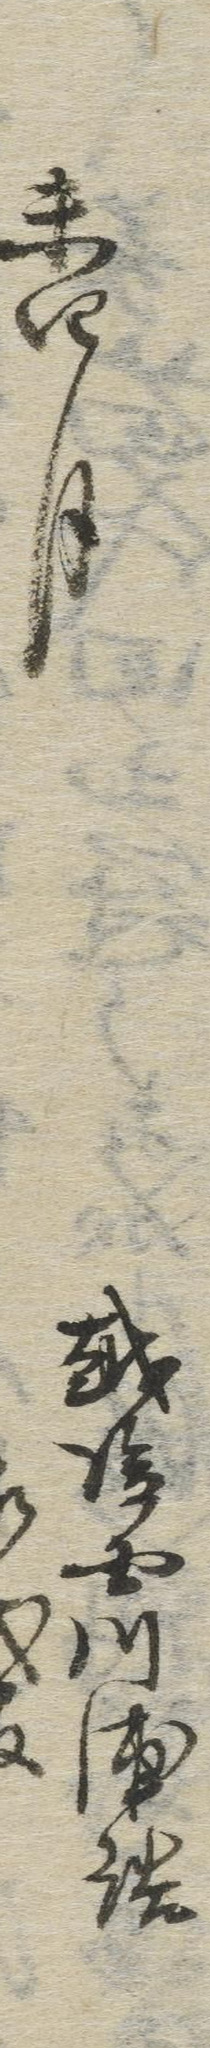未四月越後国川浦詰
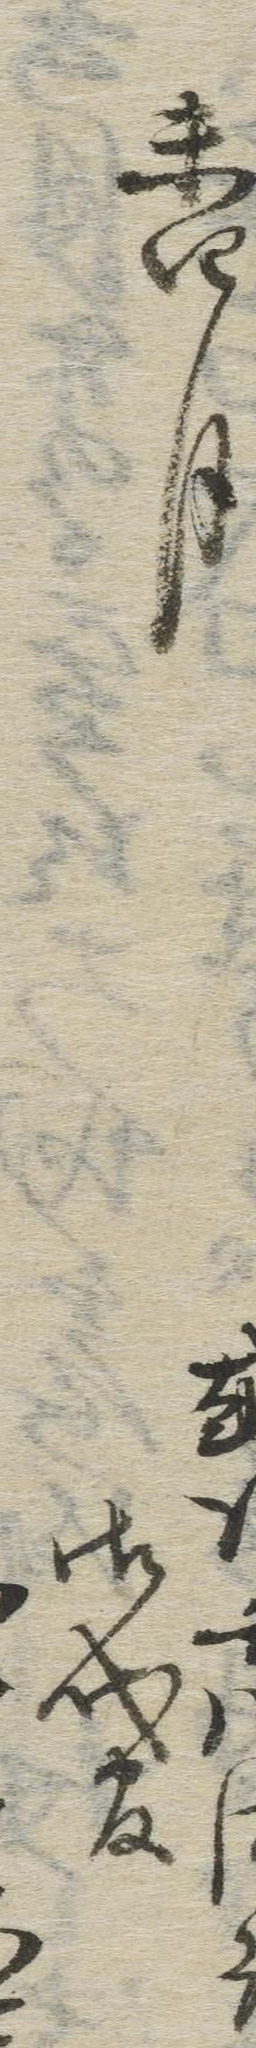御代官
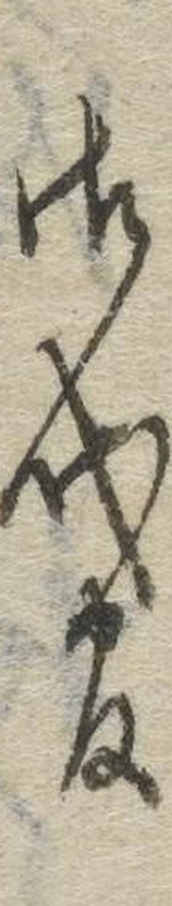御代官
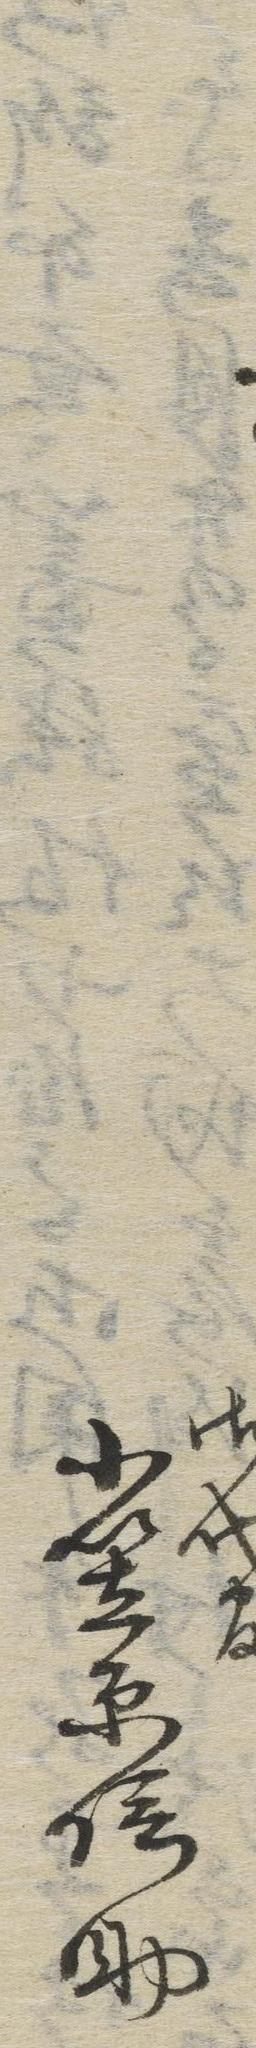小笠原信助
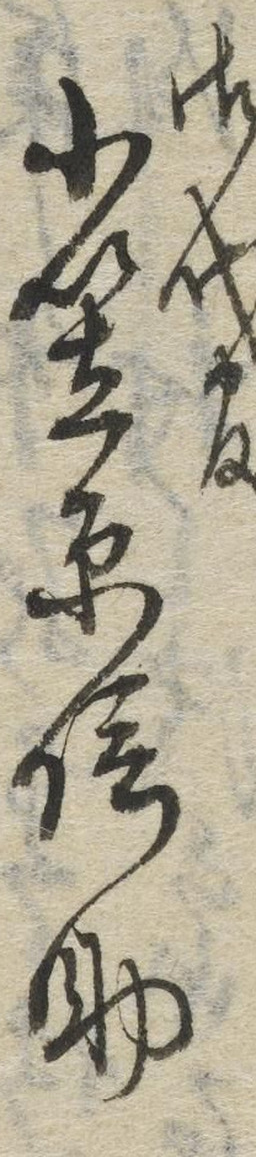小笠原信助
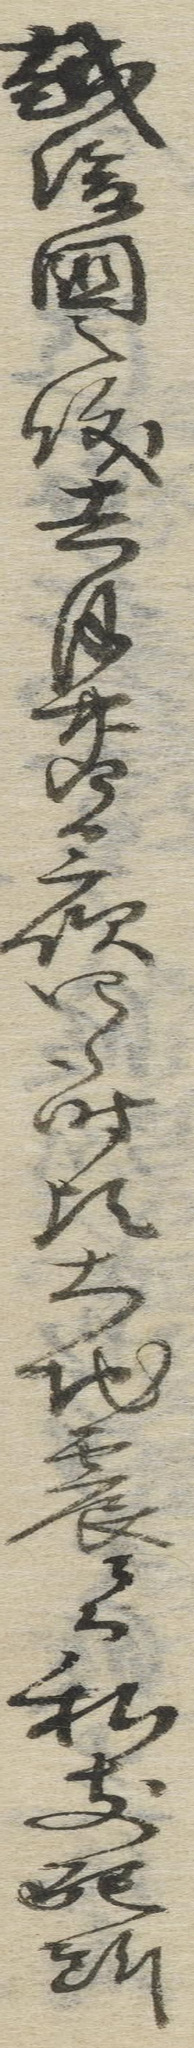越後国之儀去月廿四日夜四ッ時頃大地震二而私支配所
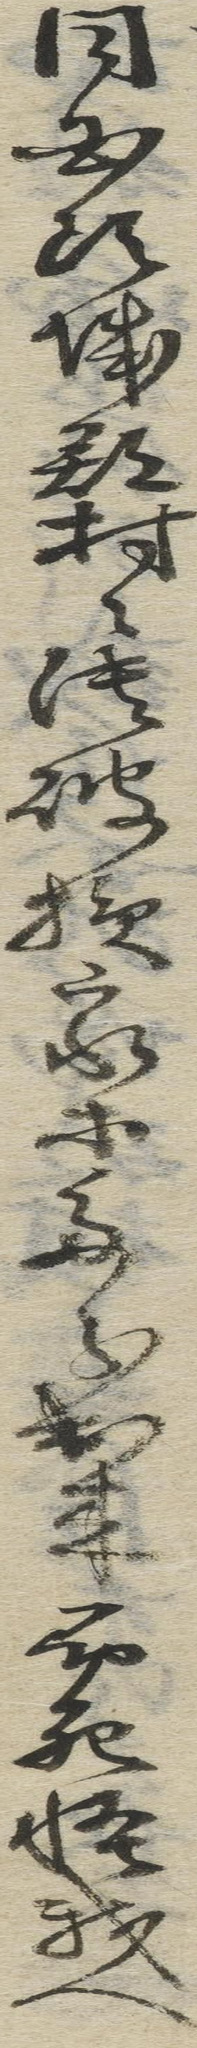同国頸城郡村々潰破損家等多分出来即死怪我人
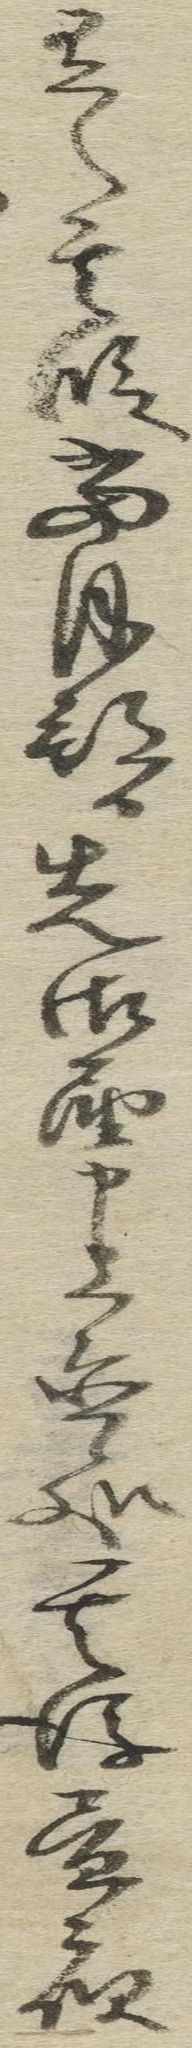有之其段当月都而先御届申上置候処其後昼夜
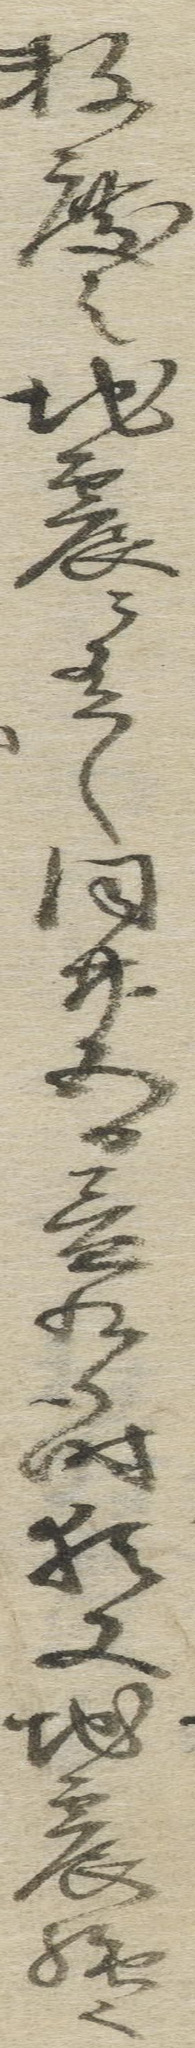数度之地震二有之同廿九日昼九ッ時猶又地震強く
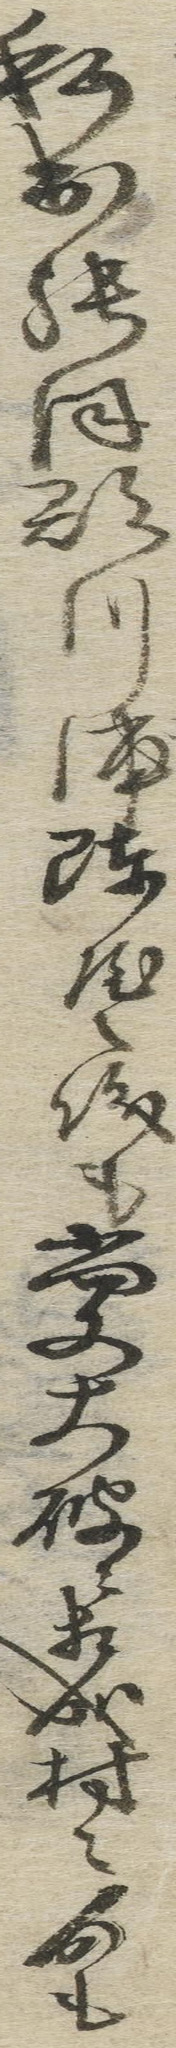私出張同郡川浦陣屋之儀も猶又大破二相成村々ゟも
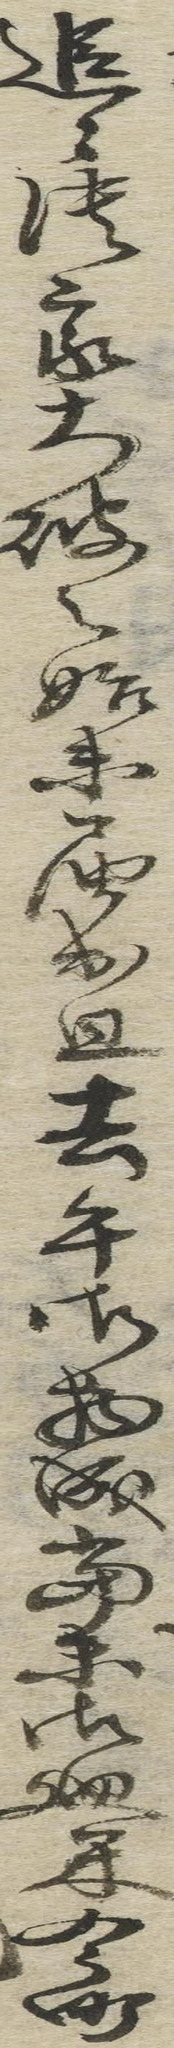追々潰家大破之始末届出且去午御物成当未御廻米今町
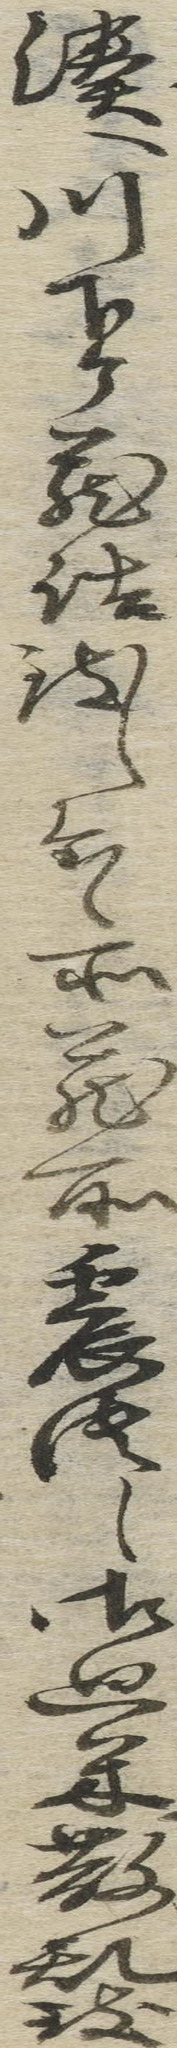湊へ川下ヶ蔵詰致し置候所蔵所震潰し御廻米散乱致
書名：信濃越後　地震書留
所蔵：東京大学地震研究所図書室 Earthquake Research Institute Library, The University of Tokyo, JAPAN
